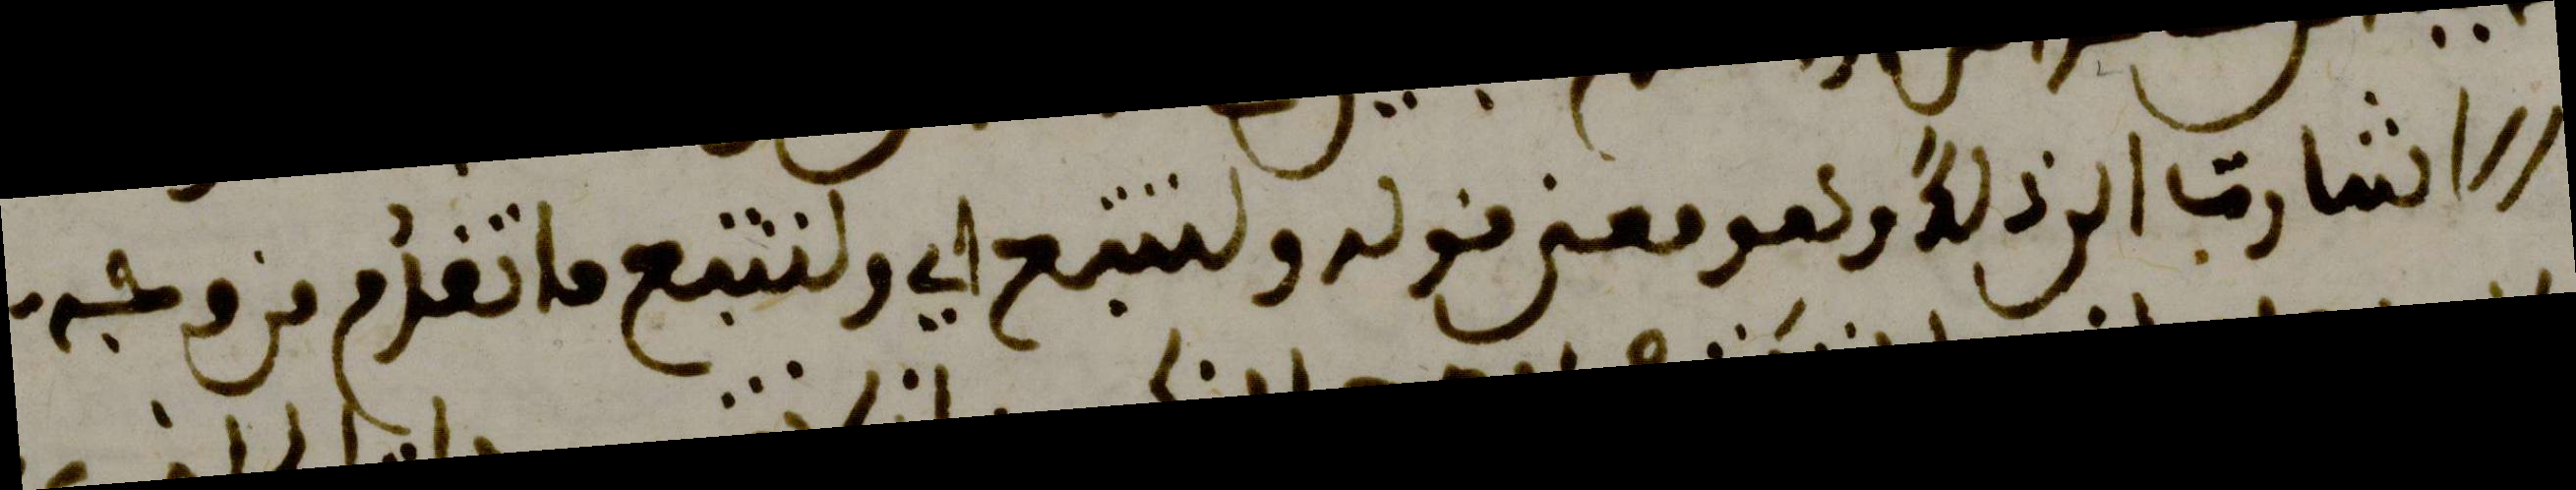الاشارت الى ذلك وهو معنى قوله ولتتبع اي ولتتبع ما تقدم من وجه
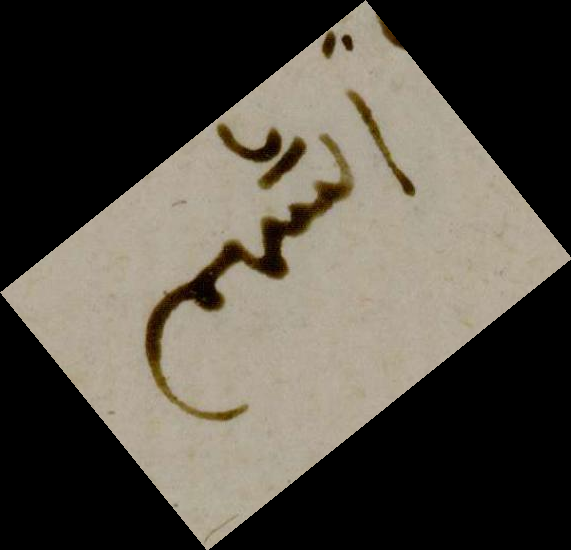السَّهم
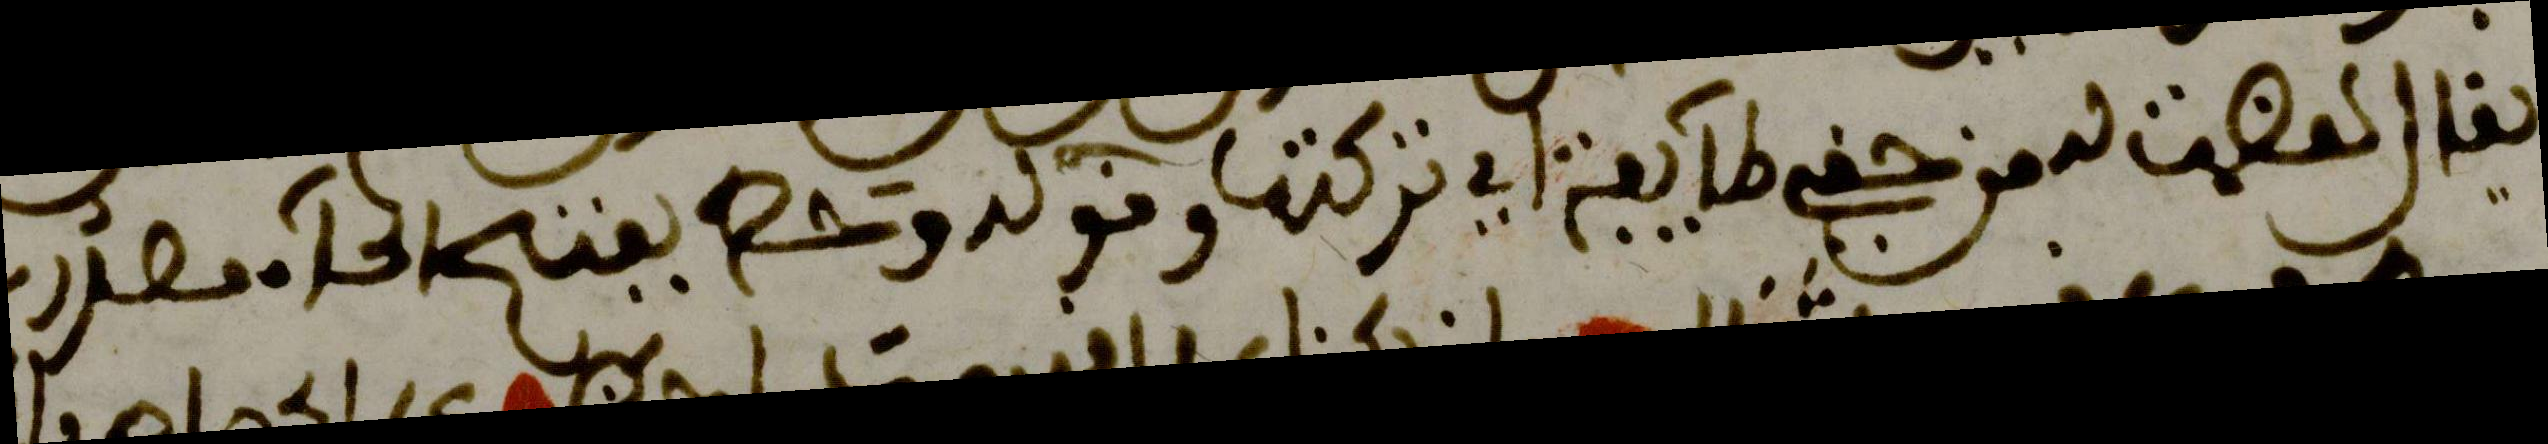يقال هضمت له من حفي طائفة اي تركتها وقوله وحَط بفتح الحاء مصدر
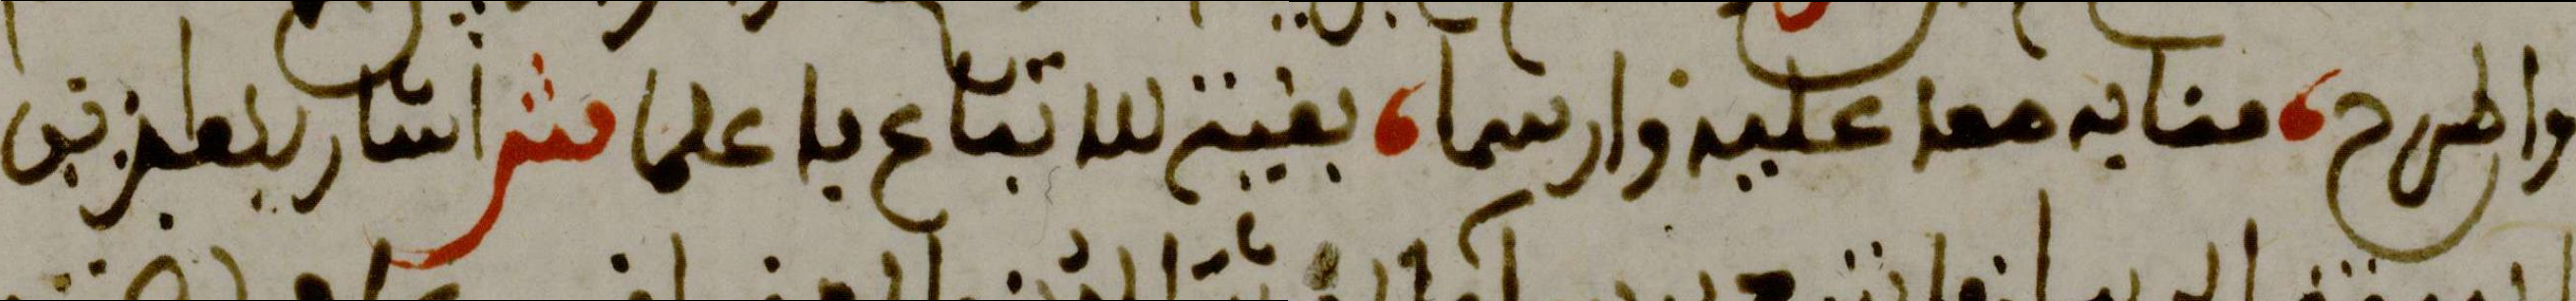واطرح منابه مما عليه وارسما بقية للاتباع فاعلما ش اشار بهاذين
